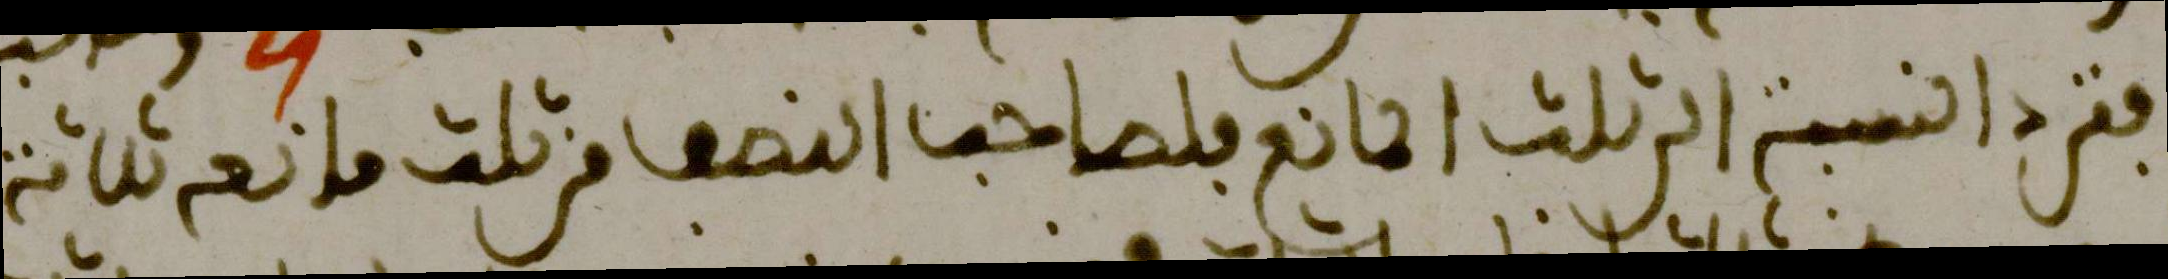فترد النسبة الى ثلث المانع فلصاحب النصف من ثلث مانعه ثلاثة
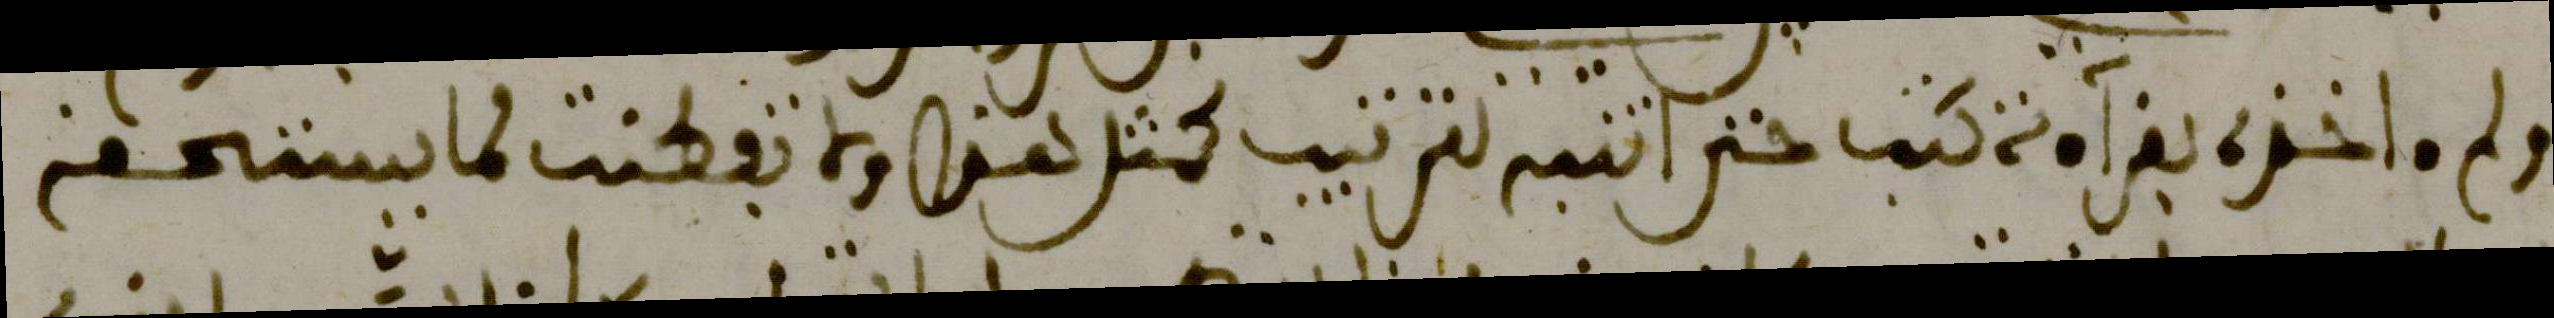ولم ءاخذه بقراءة كتب حتى اتنبه لترتيب كمثل هذا ولا تفطنت لما يستحقه
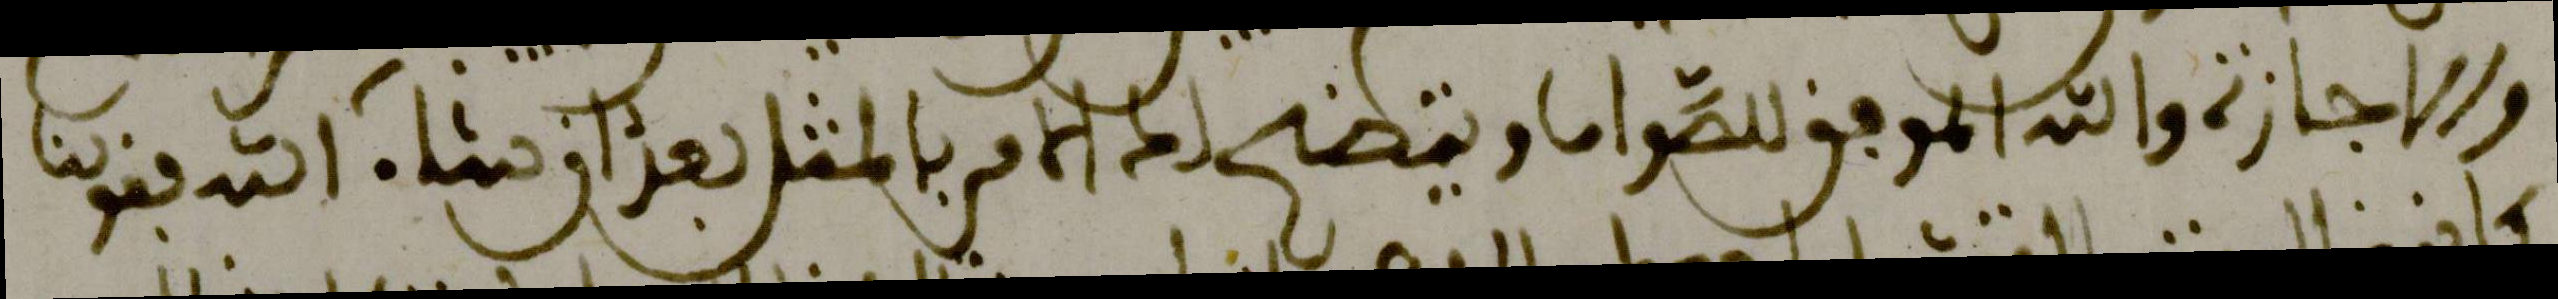والاجازة والله الموفق للصَّواب ويتضح لك الامر بالمثل بعد ان شاء الله فقولنا
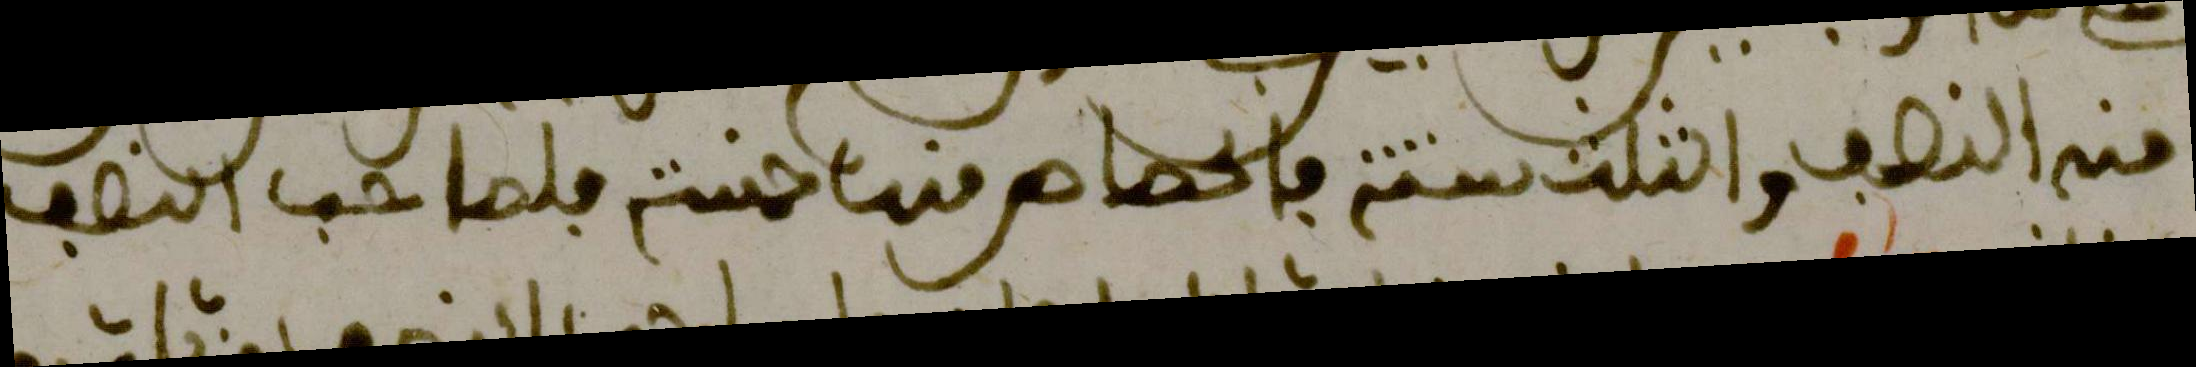منه النصف والثلث ستة فالحصاص منها خمسة فلصاحب النصف
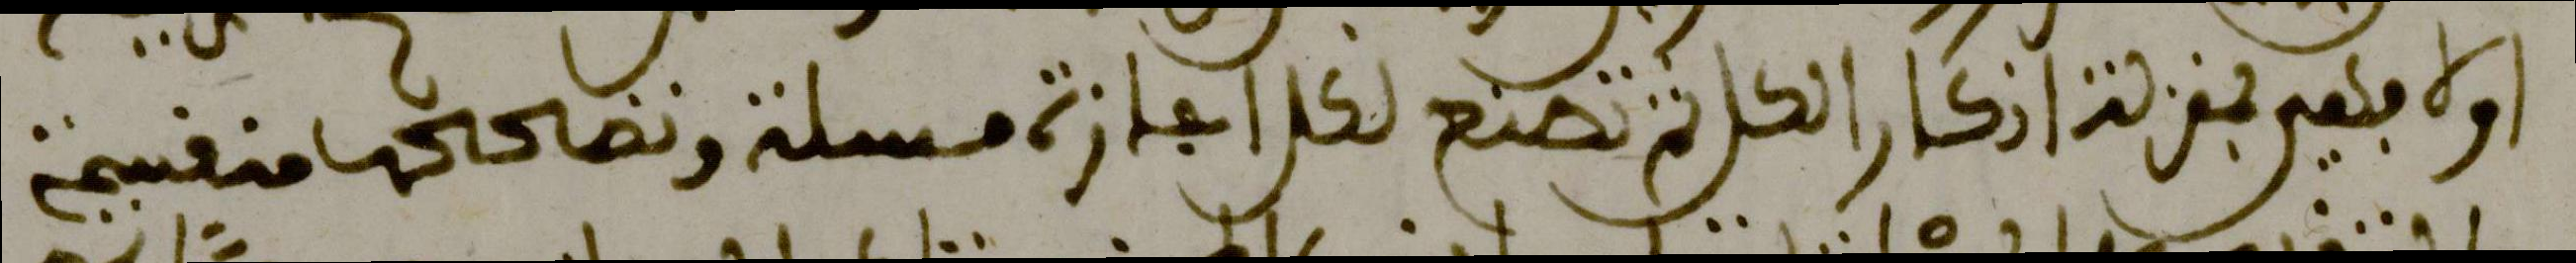اولا فهي بمنزلة انكار الكل ثم تصنع لكل اجازة مسلة وتصححها منقسمة
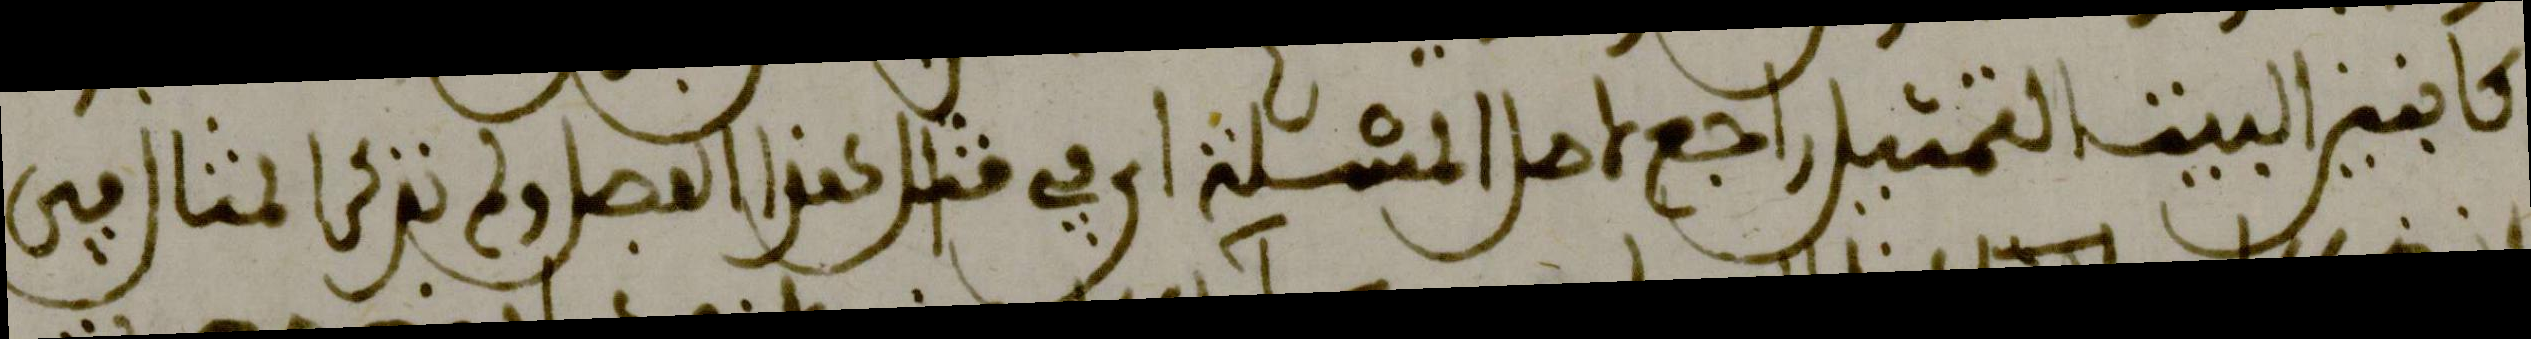كابنين البيت التمثيل راجع لاصل المسْلة اي في مثال هذا الفصل ولم نذكر المثال في
